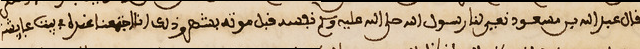قال عبد الله بن مسعود نعي لنا رسول الله صلى الله عليه وسلم نفسه قبل موته بشهر وذلك انا اجتمعنا عنده في بيت عايشة
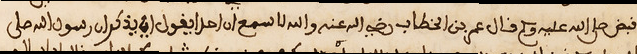قبض صلى الله عليه وسلم قال عمر بن الخطاب رضي الله عنه والله لا سمع ان احدا يقول اي يذكر ان رسول لله صلى
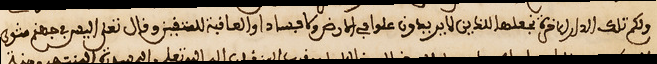ولكم تلك الدار الاخرة نجعلها للذين لا يريدون علوا في الارض ولا فساد او العاقبة للمتقين وقال تعلى اليس في جهنم مثوى
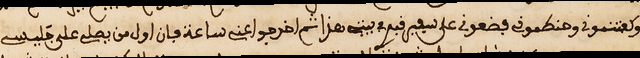وكعتنمونى وحنطمونى فضعونى على سفير قبرى في بيتى هذا ثم اخرجو اعنى ساعة فان اول من يصلى على جليسى
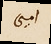امي
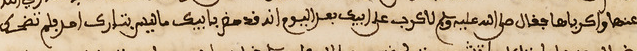عنها وا كرباها فقال صلى الله عليه وسلم لاكرب على ابيك بعد اليوم انه قد حضر بابيك مل ليس بتارك احد فلم تضحك
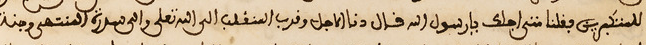للمتكبرين فقلنا متى اجلك يا رسول الله قال دنا الاجل وقرب المنقلب الى الله تعلى والى سدرة المنتهى وجنة
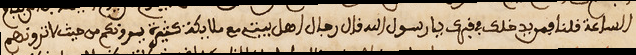الساعة قلنا فمن يدخلك في قبرك يا رسول الله قال رجال اهل بيتى مع ملايكة كثيرة يرونكم من حيث لاترونهم
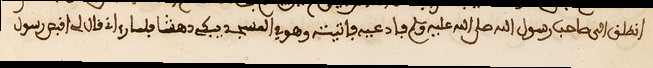انطلق الى صاحب رسول الله صلى الله عليه وسلم فادعيه فاتيته وهوفي المسجد يبكى دهشا فلما رءانى قال لى اقبص رسول
